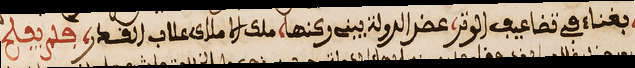بغناء في تضاعيف الوتر عضد الدولة يبني ركنها ملك الا ملاك علاب القدر فلم يفلح
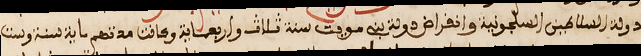دولة السلاطين السلجونية و انقراض دولة بني مويت سنة ثلاث و اربعماية و كانت مدتهم ماية سنة و ست
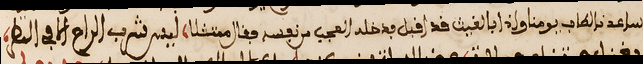ساعدنا لطاب يومنا و اذا بالغيث قد اقبل فدخله العجب من نفسه فقال ممتثلا ليس شرب الراح الا في المطر
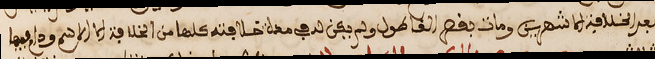بعد الخلافة الا شهرين و مات بقصر القاطول و لم يكن له في مدة خلافته كلها من الخلافة الا الاسم و دام فيها
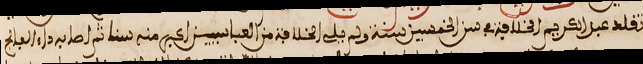تقلد عبد الكريم الخلافة في سن الخمسين سنة و لم يلى الخلافة من العباسيين اكبر منه سنا ثم اصابه داء الفا###
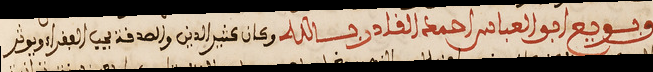و بويع ابو العباس احمد القادر بالله و كان كثير الدين و الصدقة و يحب الفقراء و يوثر
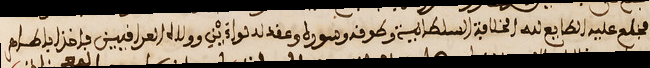فخلع عليه الطايع لله الخلافة السلطانية و طوقه و سوره و عقد له لواءين و ولاه العراقيين فاخذ ابا طاهر
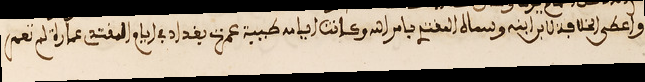و اعطى الخلافة لابن ابنه و سماه المفتي بامر الله و كانت ايامه طيبة عمرت بغداد في ايام المقتدى عمارة لم تعمر
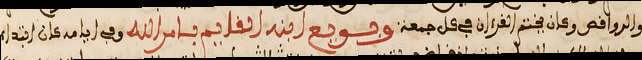و الروافض و كان يختم القرءان في كل جمعة و بويع ابنه القايم بامر الله و في ايامه كان ابتداء
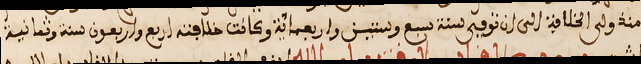منذ ولى الخلافة الى ان توفى سنة سبع و ستين و اربعماية و كانت خلافته اربع و اربعون سنة و ثمانية
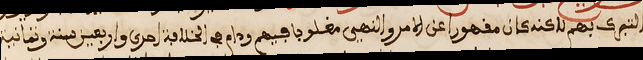التبرك بهم لاكنه كان مقهورا عن الامر و النهي مغلوبا فيهم و دام في الخلافة احدى و اربعين سنة و تمانية
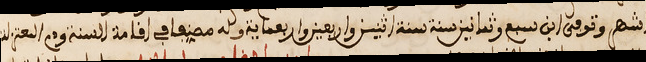اشهر و توفى ابن سبع و ثمانين سنة سنة اثنين و اربين و اربعماية و له ### في اقامة السنة و دم المعتزلة
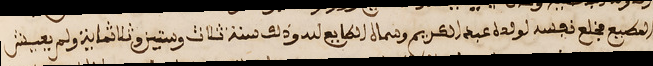المطبع فخاع نفسه لولده عبد الكريم و سماه الطايع لله و ذلك سنة ثلاث و ستين و ثلاثماية و لم يعيش
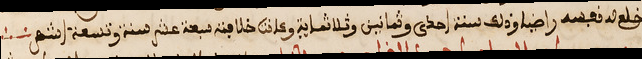خلع له نفسه راضيا و ذلك سنة احدى و ثمانين و ثلاثماية و كانت خلافته سبعة عشر سنة و تسعة اشهر
